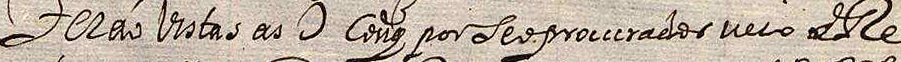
Foraõ Vistas as ꝯdas Con q̄ por seo procurador ueio a Re
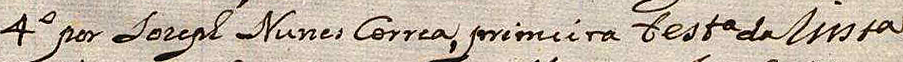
4o por Iozeph Nunes Correa, primeira testa da Iusta
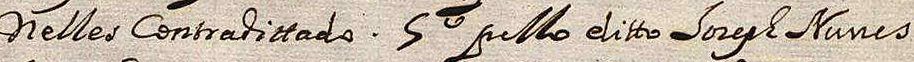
Nelles Contradittado. 5o pello ditto Iozeph Nunes
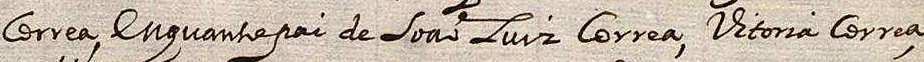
Correa, Enquanto pai de Ioaõ Luiz Correa, Vitoria Correa,
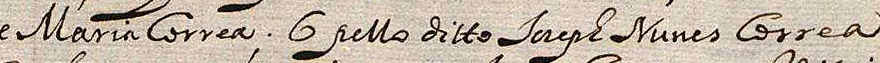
e Maria Correa; E pello ditto Iozeph Nunes Correa
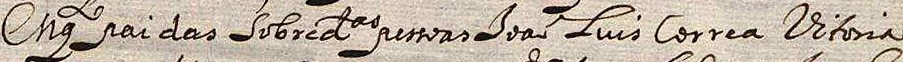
Enqto pai das Sobred̄as pessoas Ioaõ Luis Correa Vitoria
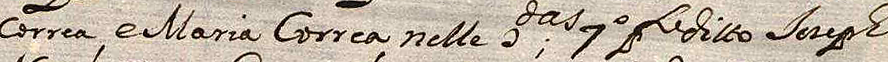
correa, e Maria Correa, nelle ꝯdas; 7o plo ditto Iozeph
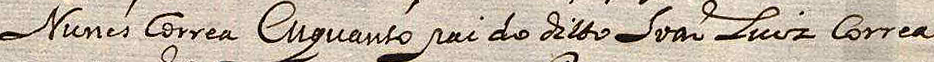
Nunes Correa Enquanto pai do ditto Ioaõ Luiz Correa
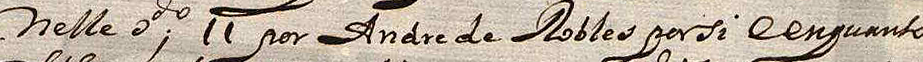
Nelle ꝯdo; 11 por Andre de Robles por si e enquanto
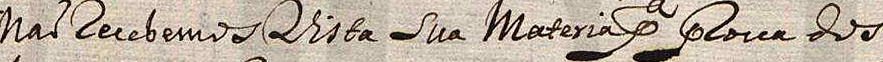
naõ Recebemos Vista Sua Materia pa pRoua dos
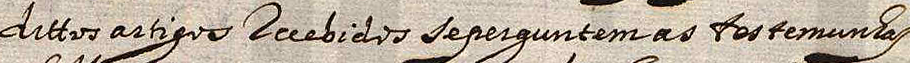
dittos artigos Recebidos se perguntem as testemunhas
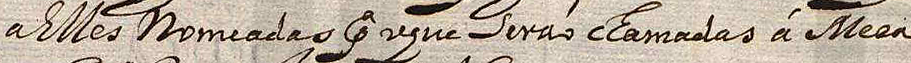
a Elles Nomeadas pa o que Seraõ chamadas á Meza
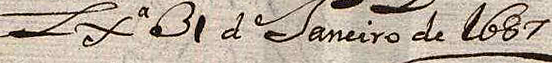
LXa 31 de Ianeiro de 1687
